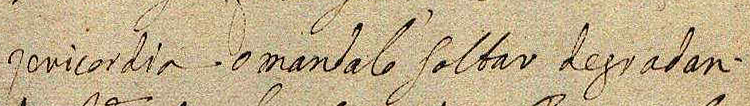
zericordia o mandalo soltar degradan
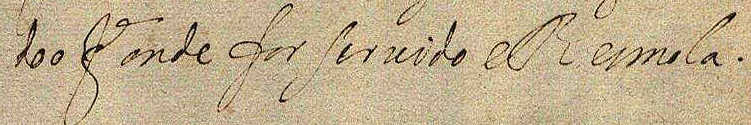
doo pa onde for seruido e R esmola.
